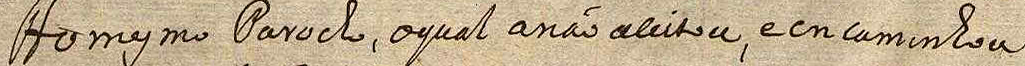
Ao mesmo Parocho, o qual a naõ aceitou, e encaminhou
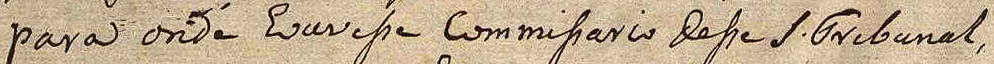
para onde houvesse Commissario desse S. Tribunal,
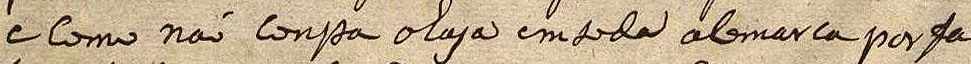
e como naõ consta o haja em toda a Comarca por fa
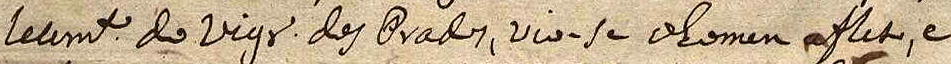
lecim.to do Vig.r dos Prados, vio-se o homen aflito, e
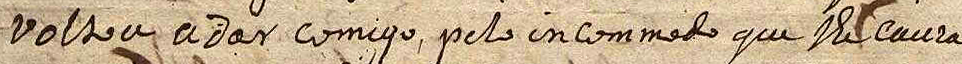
voltou a dar comigo, pelo incommodo que lhe cauza
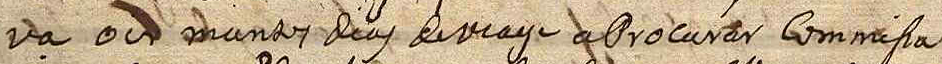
va os muntos dias de viagi a Procurar Commissa
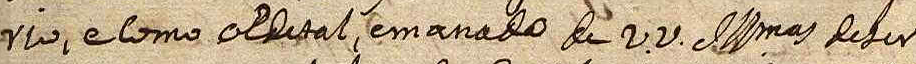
rio, e como o Edital, emanado de V.V. Ill.mas deter
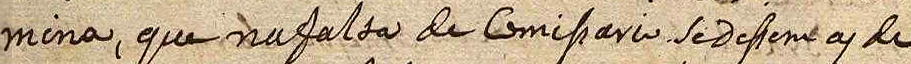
mina, que na falta de Comissario se dessem as de
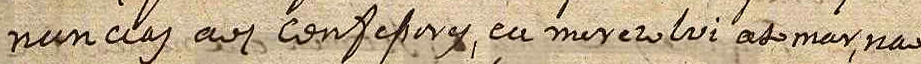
nuncias aos confessores, eu me rezolvi a tomar, naõ
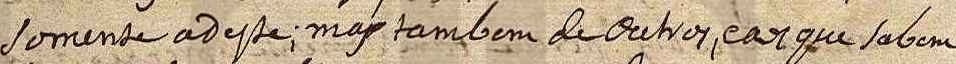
somente a deste; mas tambem de Outros,e aos que sabem
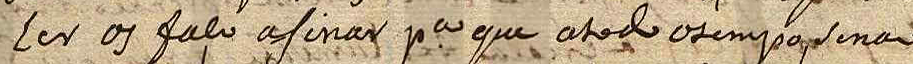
Ler os faço asinar p.a que a todo o tempo, se naõ
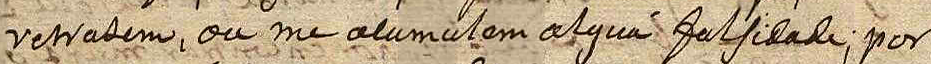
retratem, ou me acumulem alguā falsidade; por
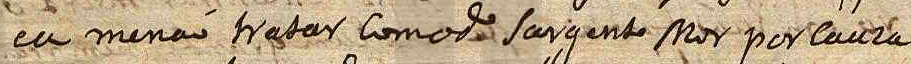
eu me naõ tratar com o d.o Sargento Mor por cauza
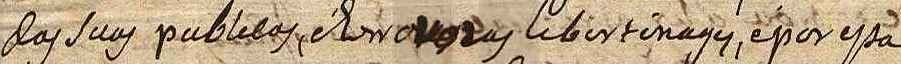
das suas publicas, e horrorozas Libertinages, e por esta
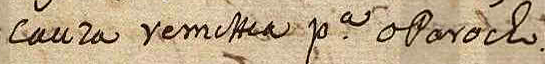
cauza remette a p.ra o Parocho:
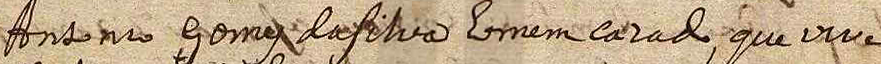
Antonio Gomes da Silva homem cazado, que vive
